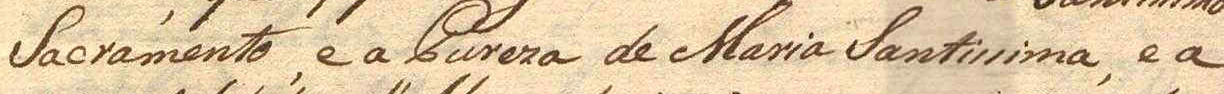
Sacramento, e a Pureza de Maria Santissima, e a
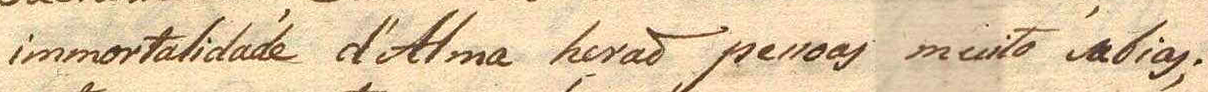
immortalidade d'Alma heraõ pessoas muito sabias;
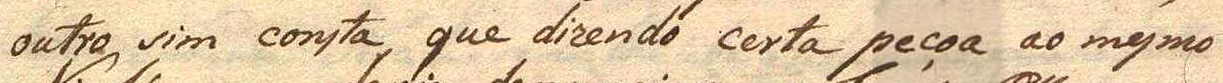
outrosim consta, que dizendo certa peçoa ao mesmo
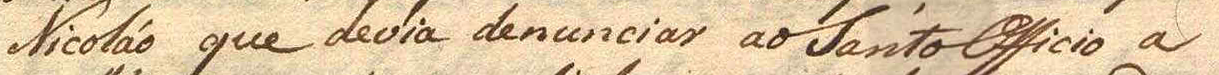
Nicoláo, que devia denunciar ao Santo Officio a
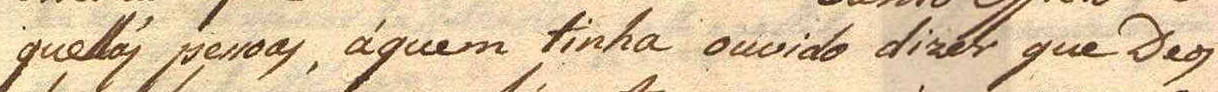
quellas pessoas, á quem tinha ouvido dizer que Deos
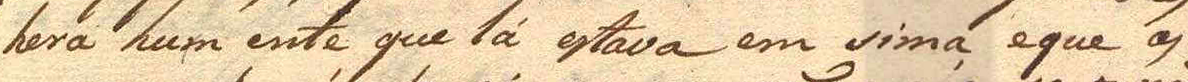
hera hum ente, que lá estava em sima, e que as
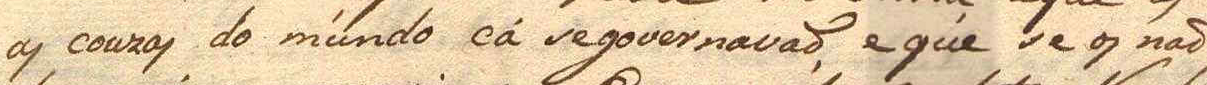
as couzas do mundo cá se governavaõ, e que se os naõ
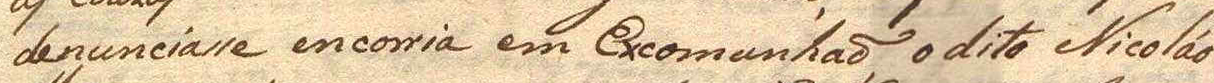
denunciasse encorria em Excomunhaõ o dito Nicoláo
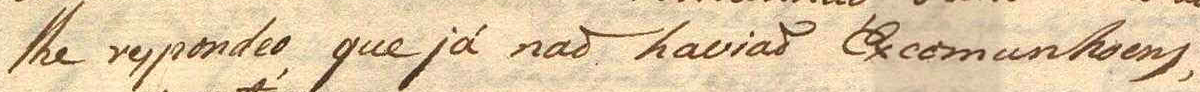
lhe respondeo, que já naõ haviaõ Excomunhoens,
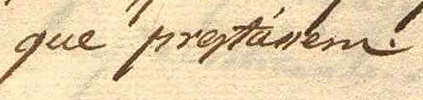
que prestassem.
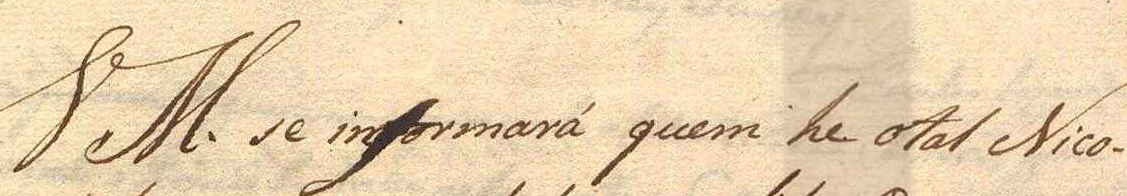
VM. se informará quem he o tal Nico
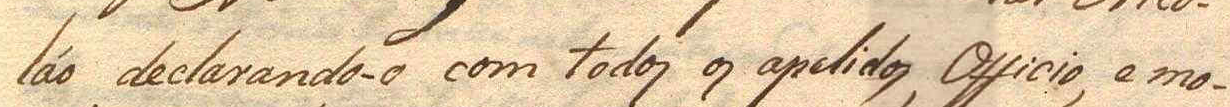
láo declarando-o com todos os apelidos, Officio, e mo
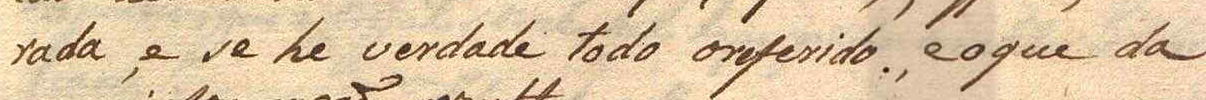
rada, e se he verdade todo o referido., e o que da
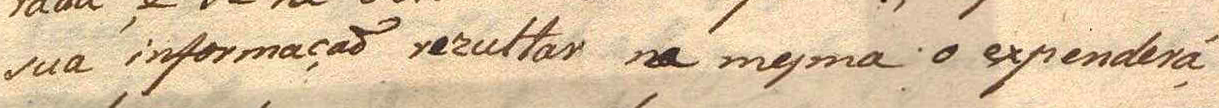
sua informaçaõ rezultar na mesma o expenderá
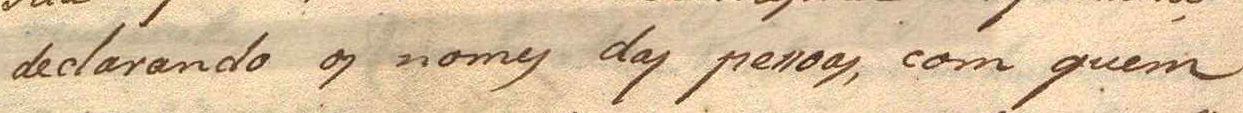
declarando os nomes das pessoas, com quem
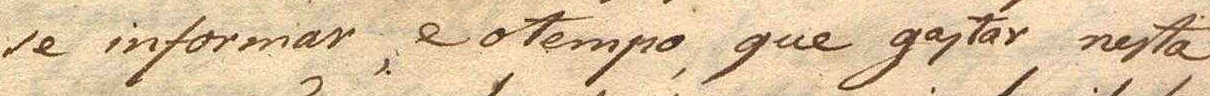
se informar, e o tempo, que gastar nesta
